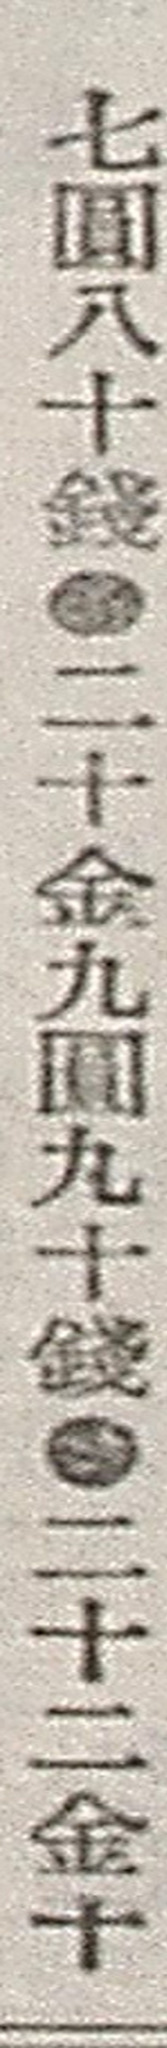七円八十銭●二十金九円九十銭二十二金十
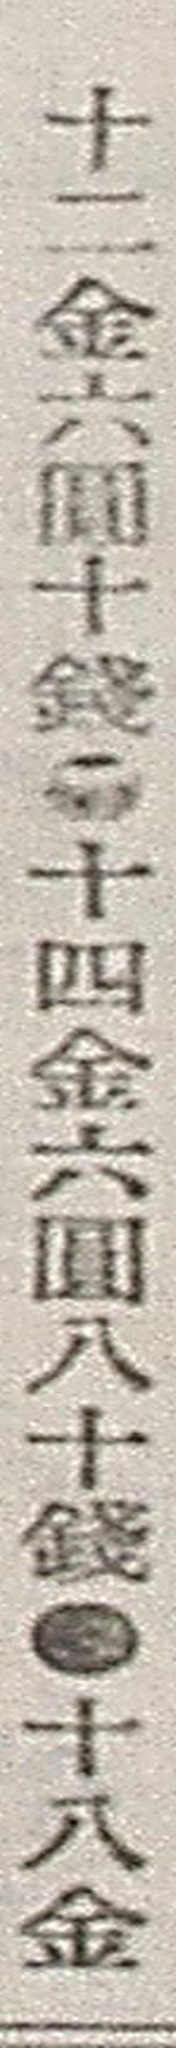十二金六円十銭●十四金六円八十銭●十八金
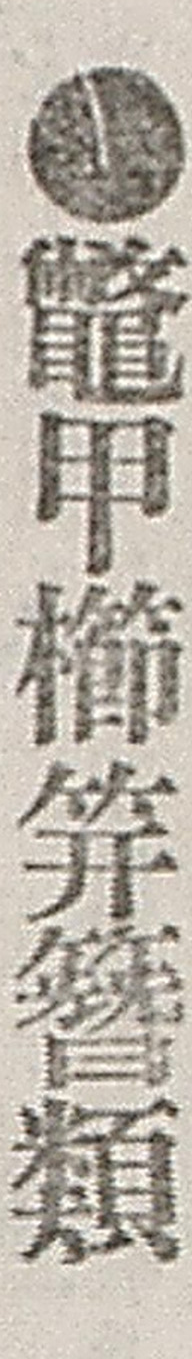●鼈甲櫛笄簪類
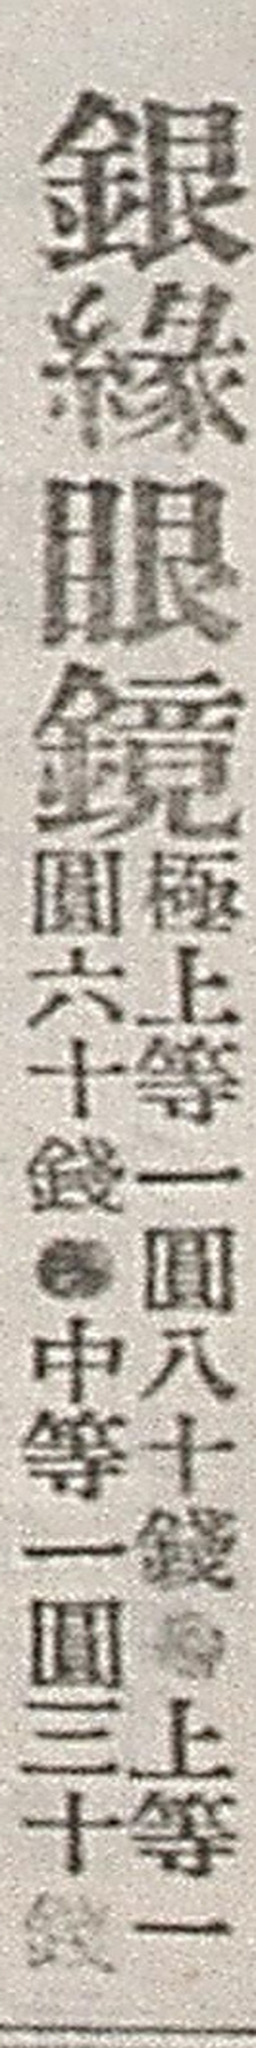金十五銭
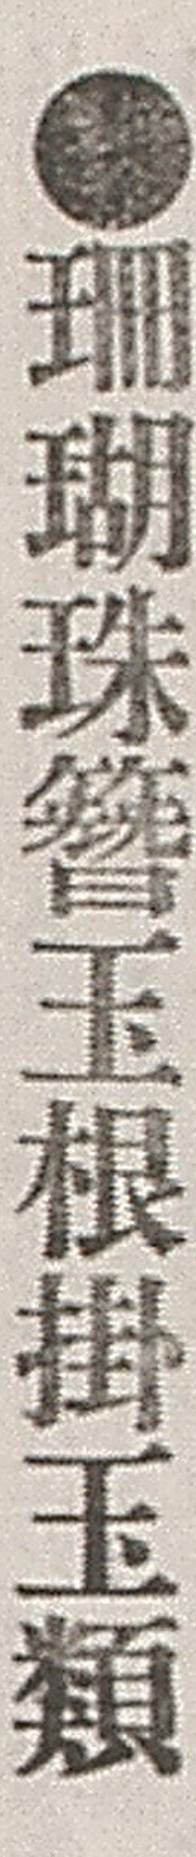●珊瑚珠簪玉根掛玉類
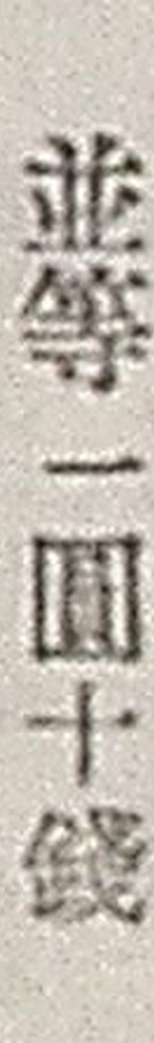並等一円十銭
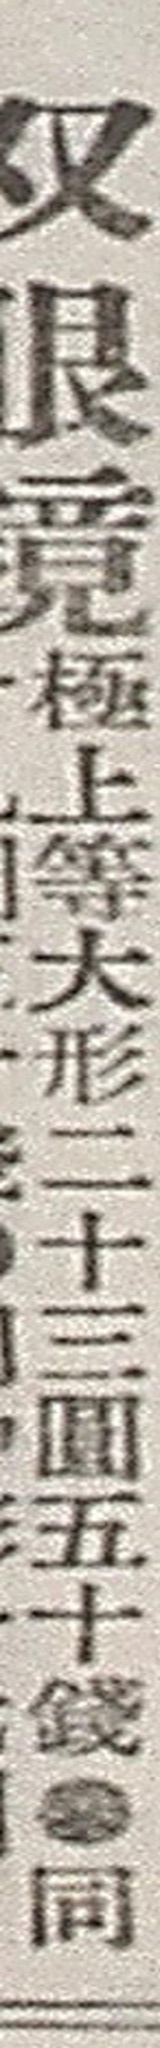双眼鏡極上等大形二十三円五十銭●同
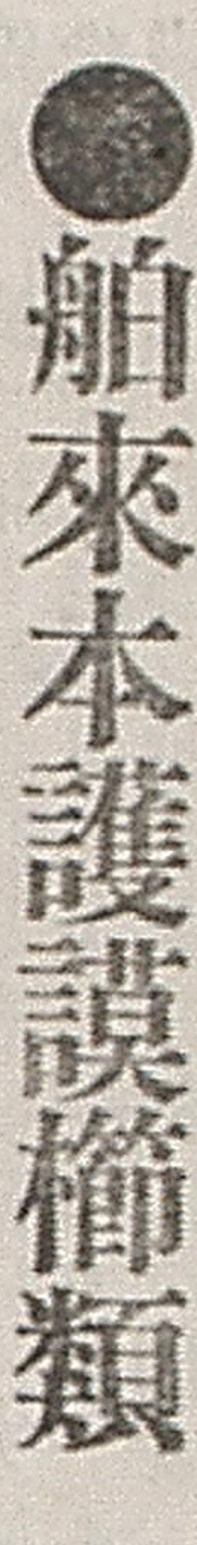●舶来本護謨櫛類
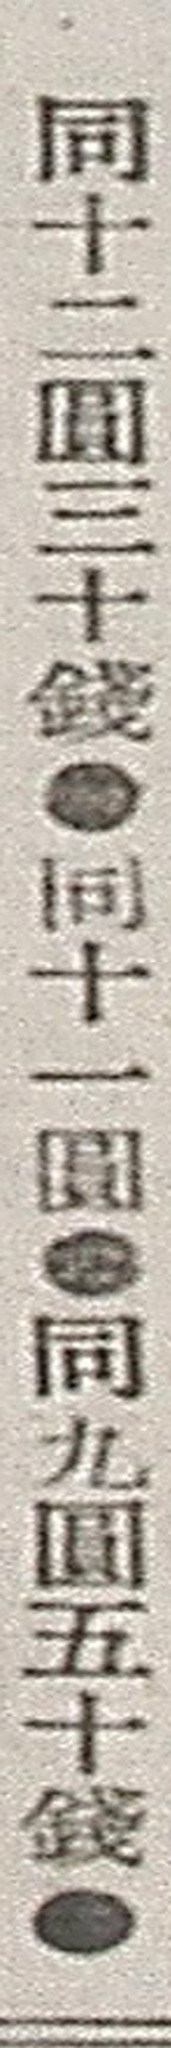同十二円三十銭●同十一円●同九円五〇銭●
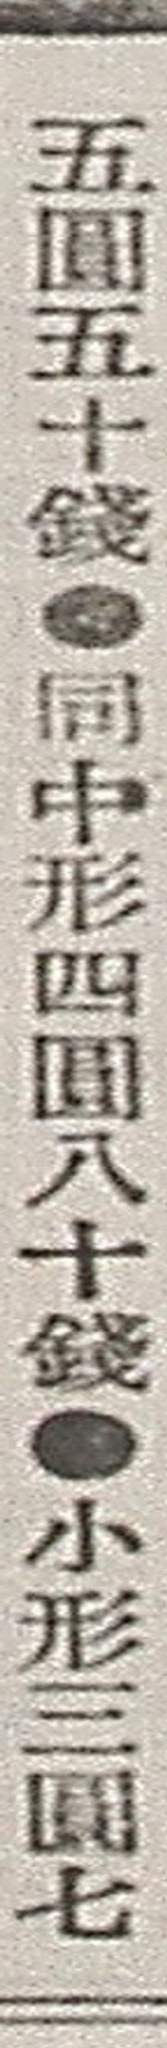五円五十銭●同中形四円八十銭●小形三円七
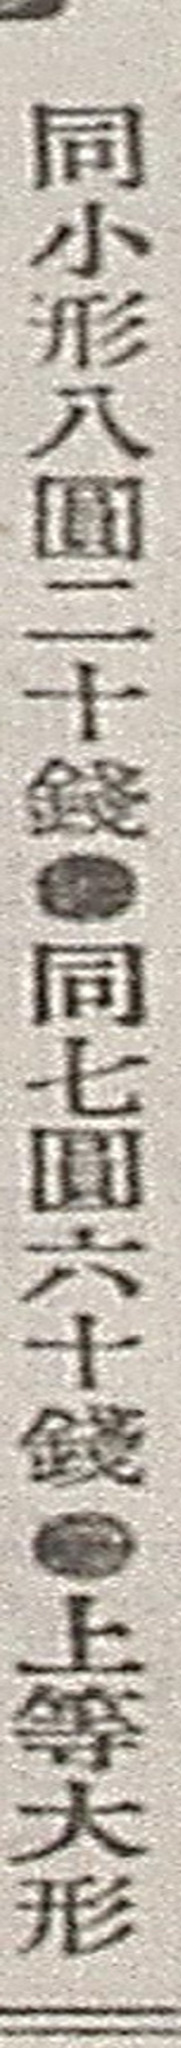同小形八円二十銭●同七円六十銭●上等大型
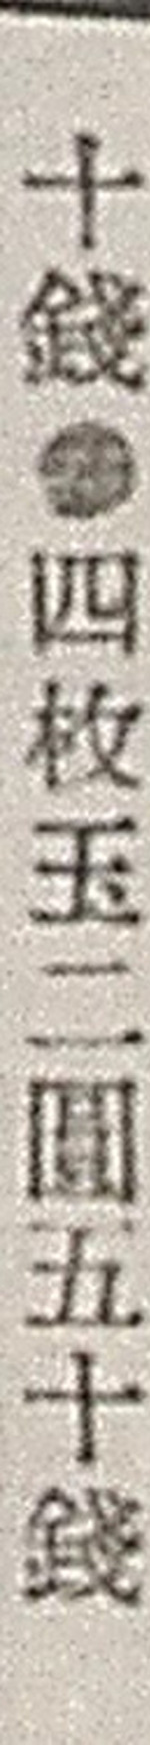十銭●四枚玉二円五十銭
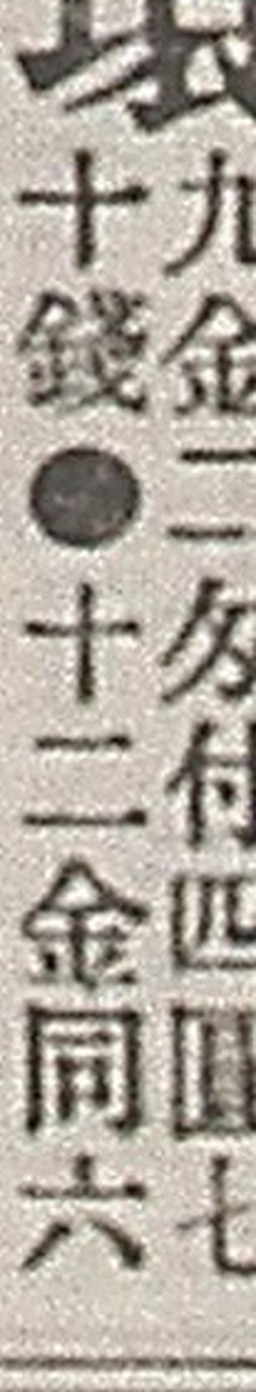十銭●十二金同六
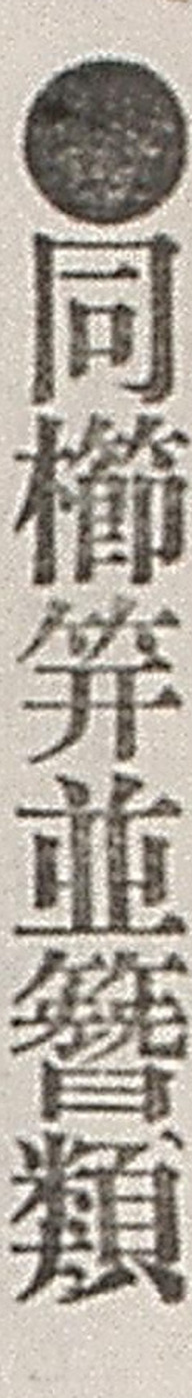●同櫛笄並簪類
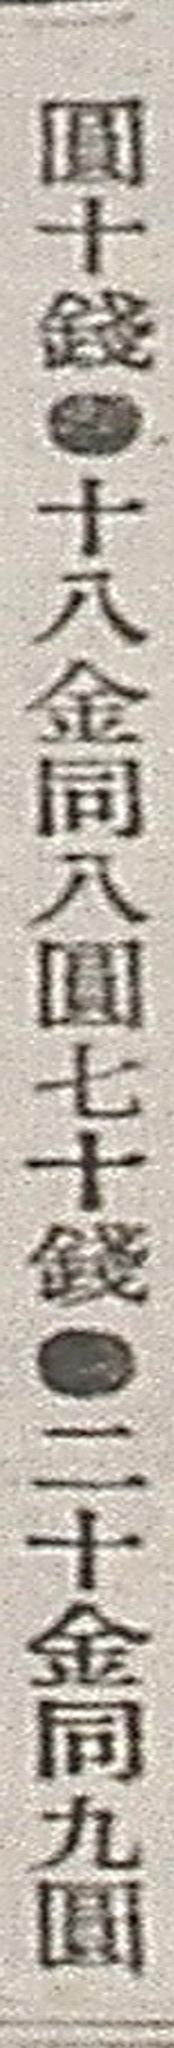円十銭●十八金同八円七十銭●二十金同九円
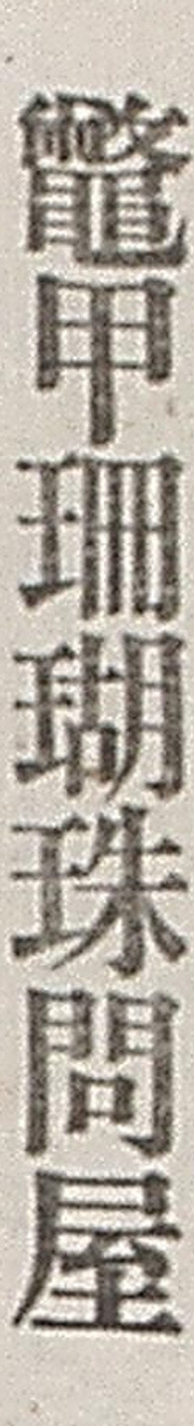鼈甲珊瑚珠問屋
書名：風俗畫報臨時増刊第百二十六號　洪水被害録（中）
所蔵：東京大学地震研究所図書室 Earthquake Research Institute Library, The University of Tokyo, JAPAN
